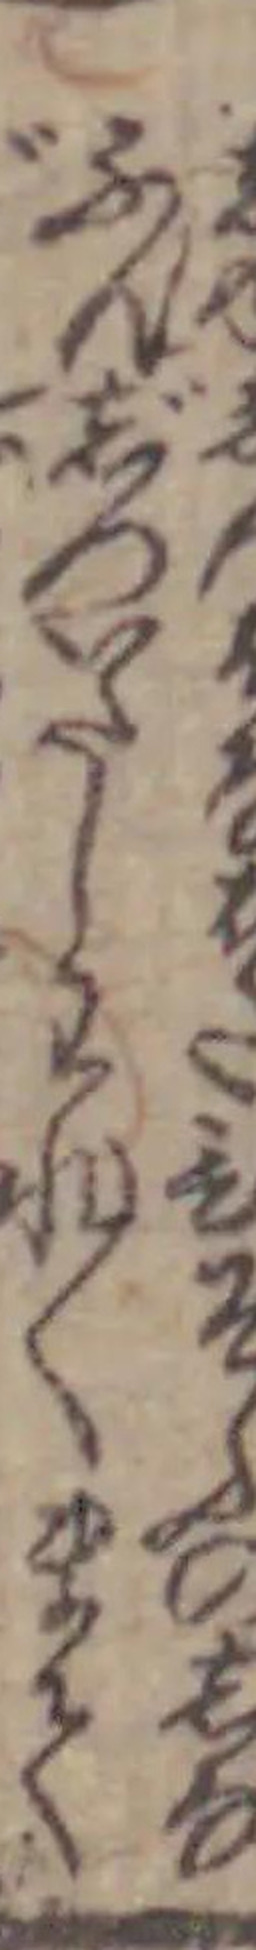ふんじついたしわれ〳〵まて
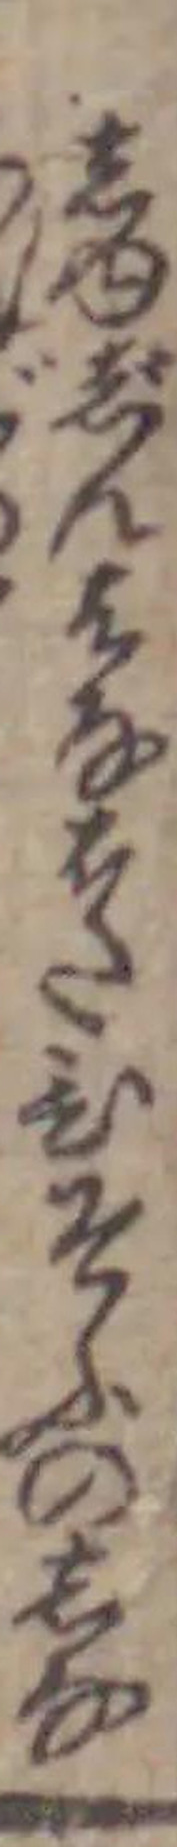しゆじんはなはたひそふのしな
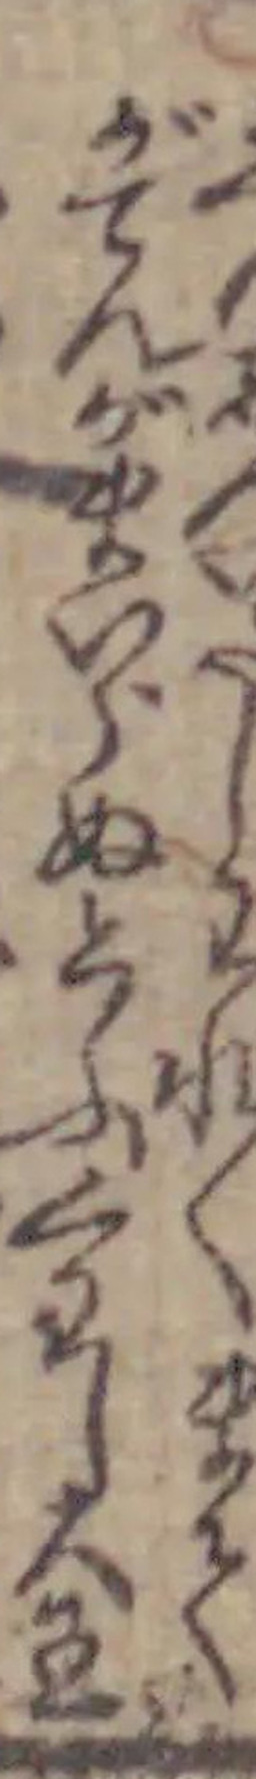がてんがまいらぬとふくわし大王
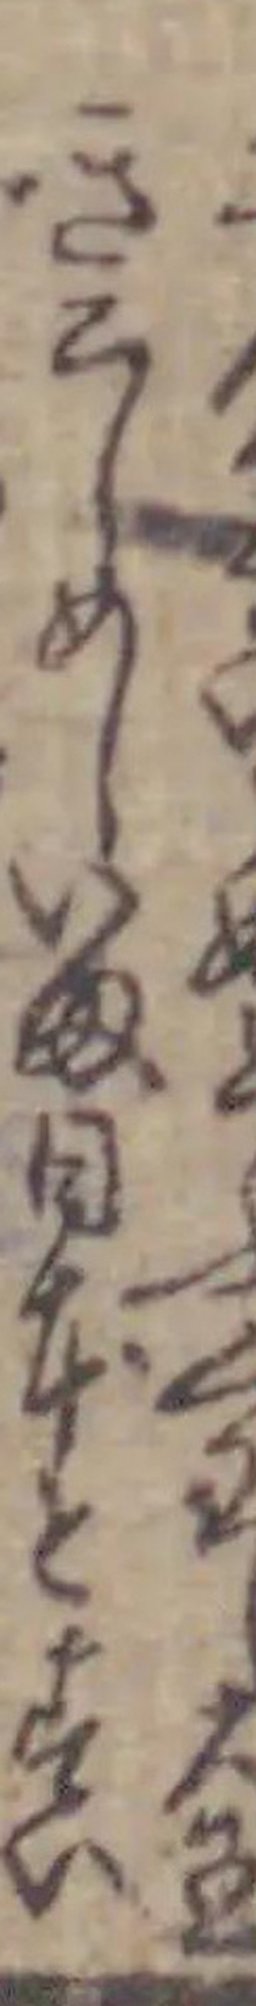きこしめしいま日本とすい
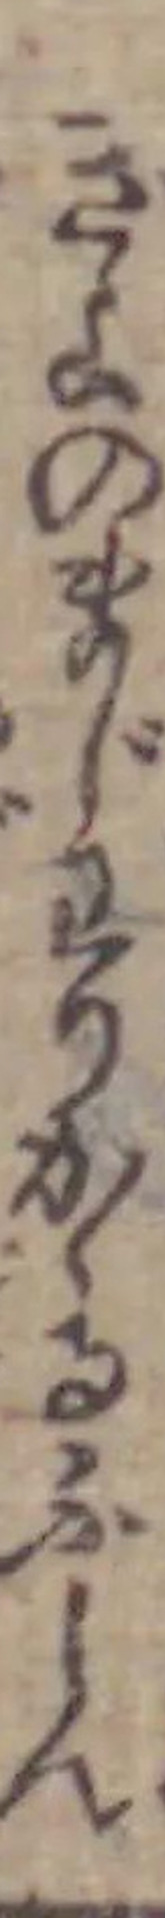ぎよのまじわりかゝるふしん
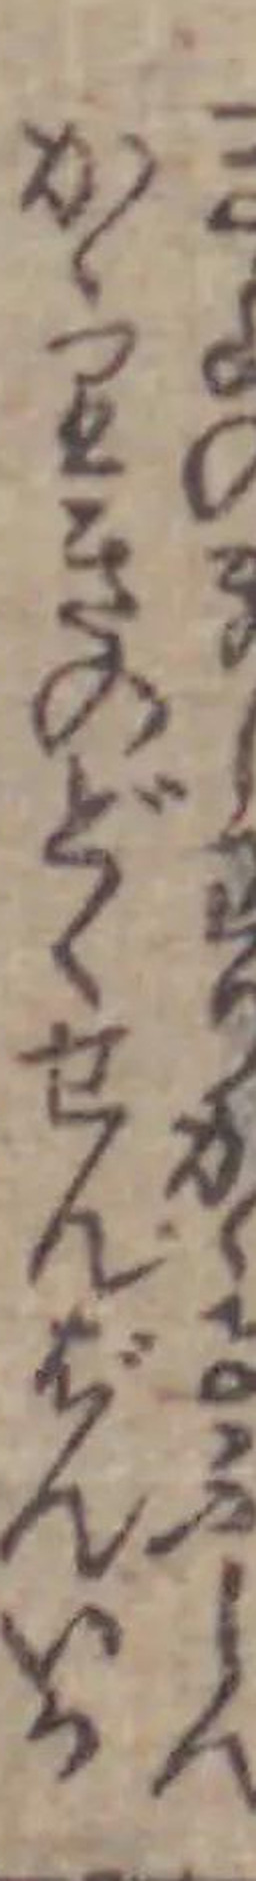かゝりきのどくせんばんいか
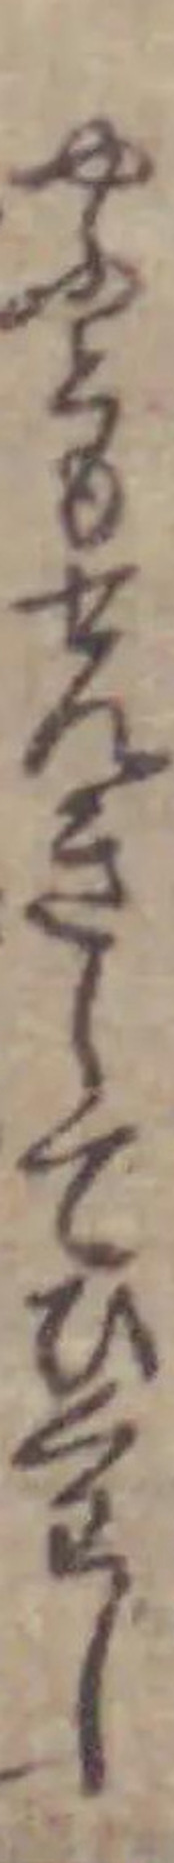やふともせんきしてひくわし
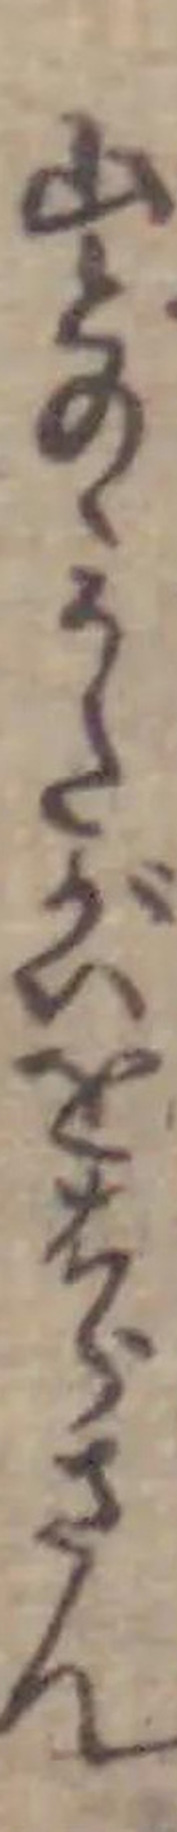山とのゝうたがいをはらさん

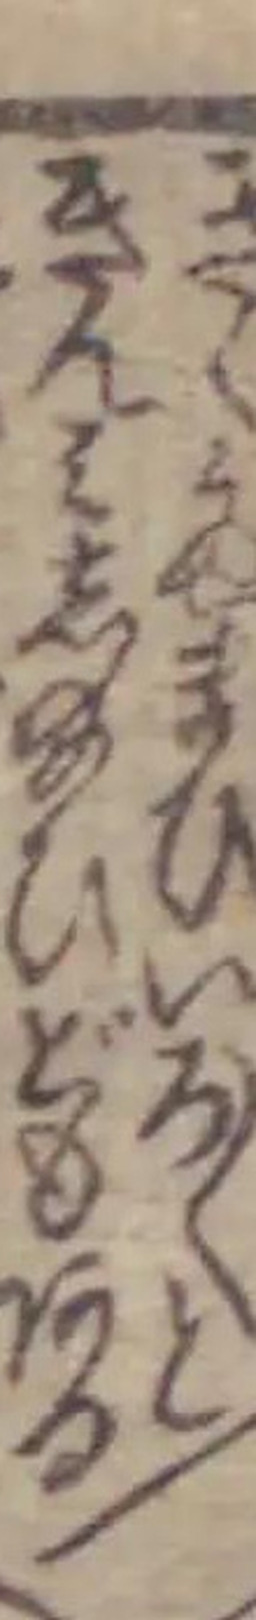きんみし給ひどもある
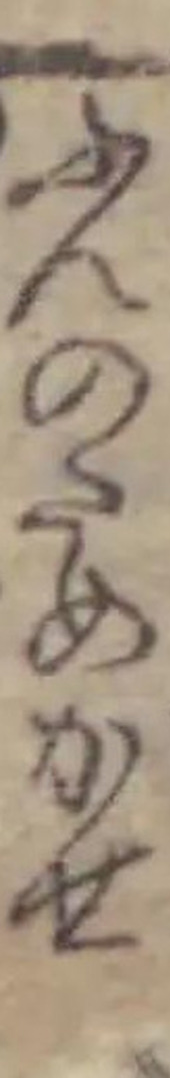ふんのためかせ
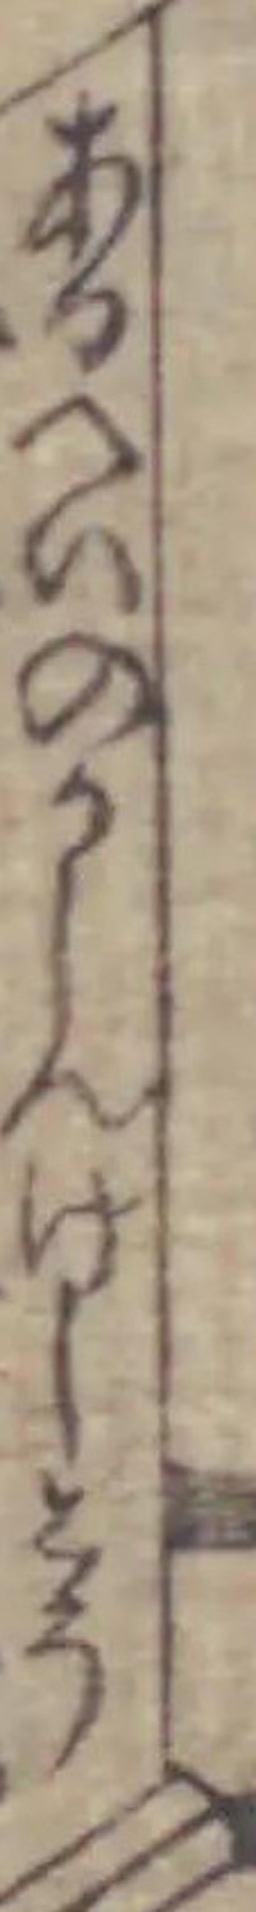あるへいのかしんけしとう
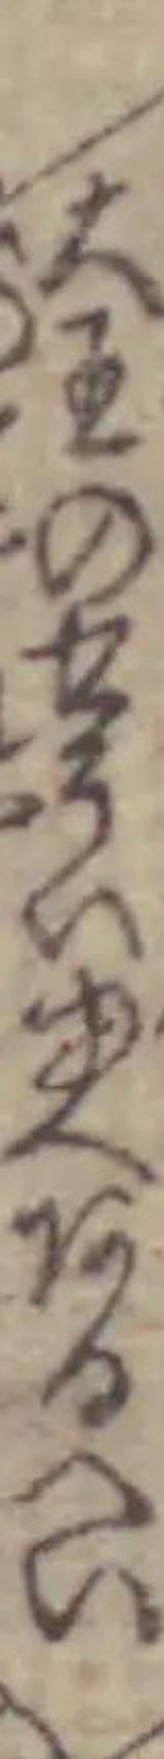大王のせういゆへあるへい
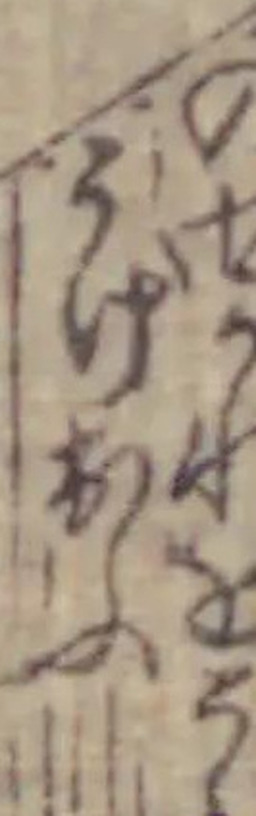うけおふ
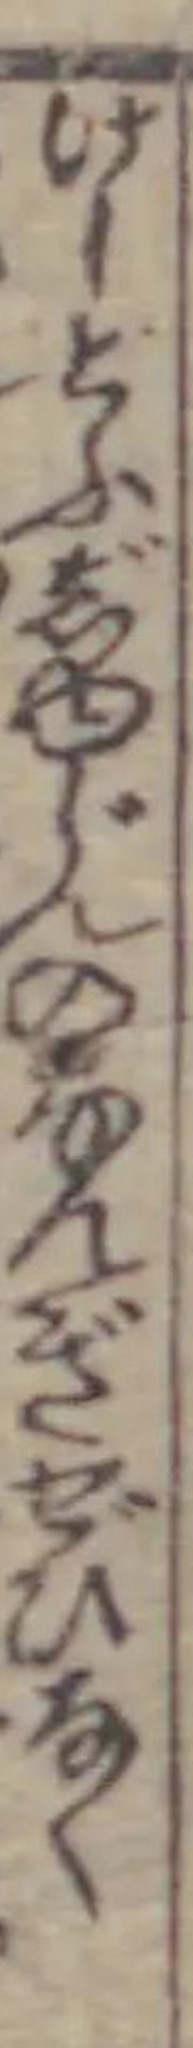けしとふしゆじんのなんぎぜひなく
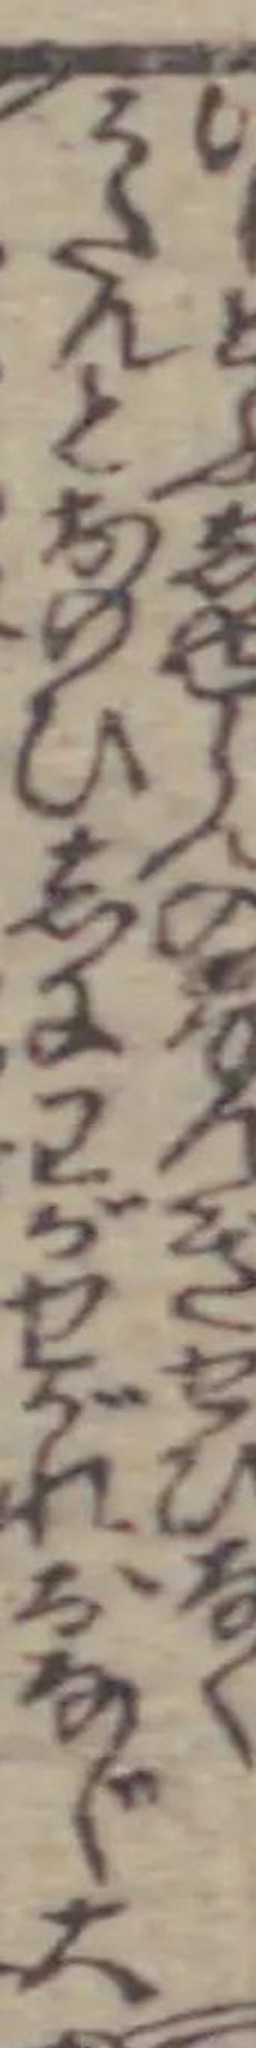うたんとおもひしにわがせがれおなじ大
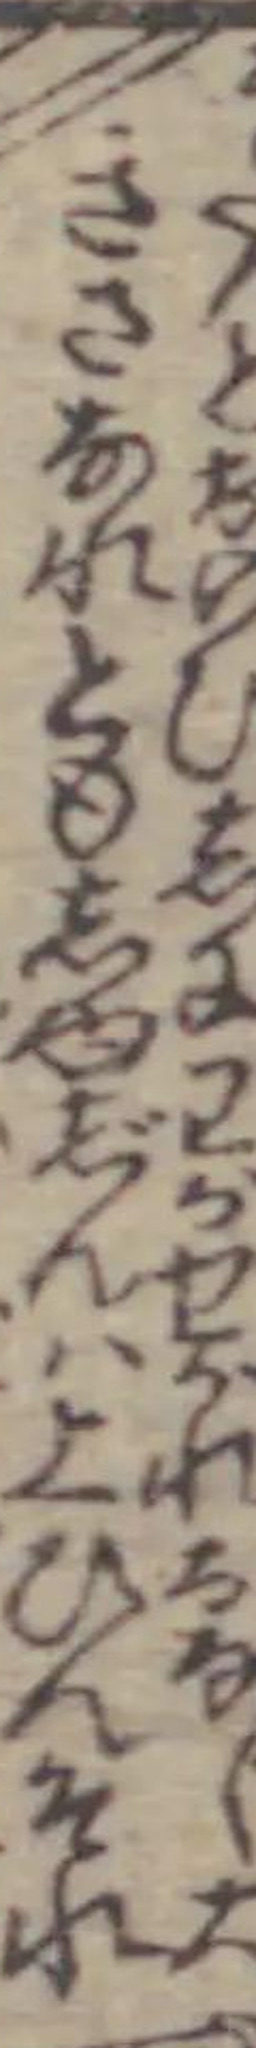きさなれともしゆじんは上ひんそれ
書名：名代干菓子山殿 3巻
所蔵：国立国会図書館 National Diet Library, JAPAN
